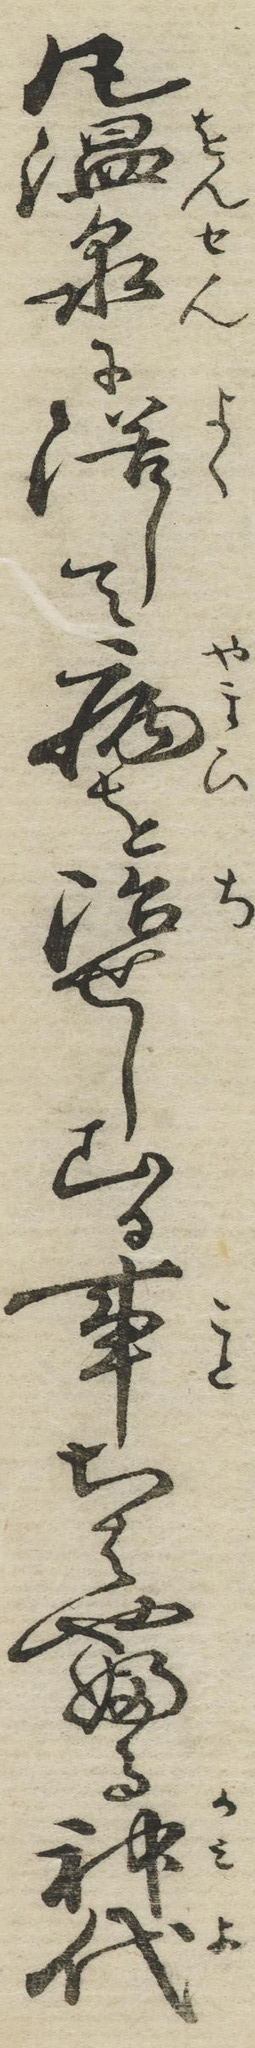凡温泉に浴して病を治せしむる事ちはやふる神代

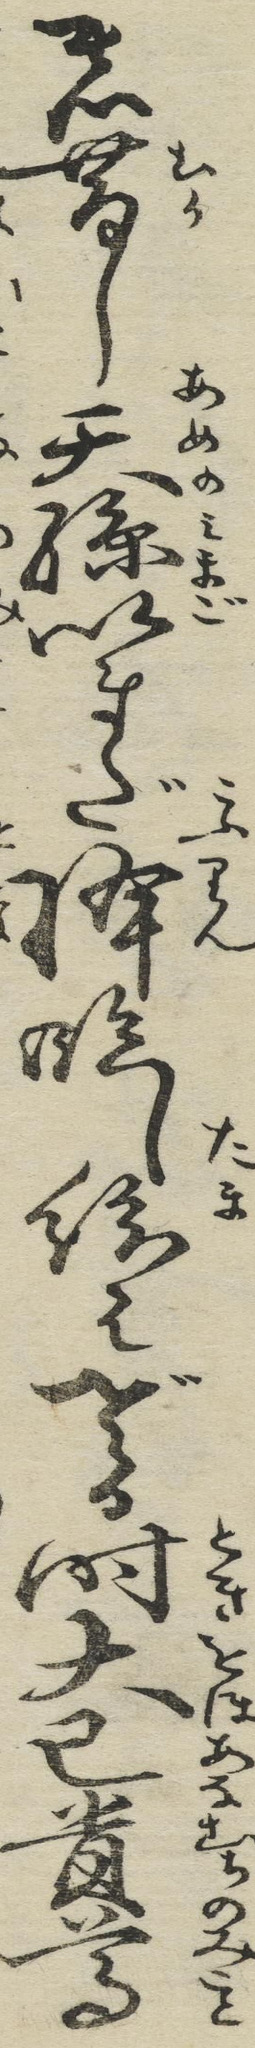の昔し天孫いまだ降臨給はざる時大己貴尊
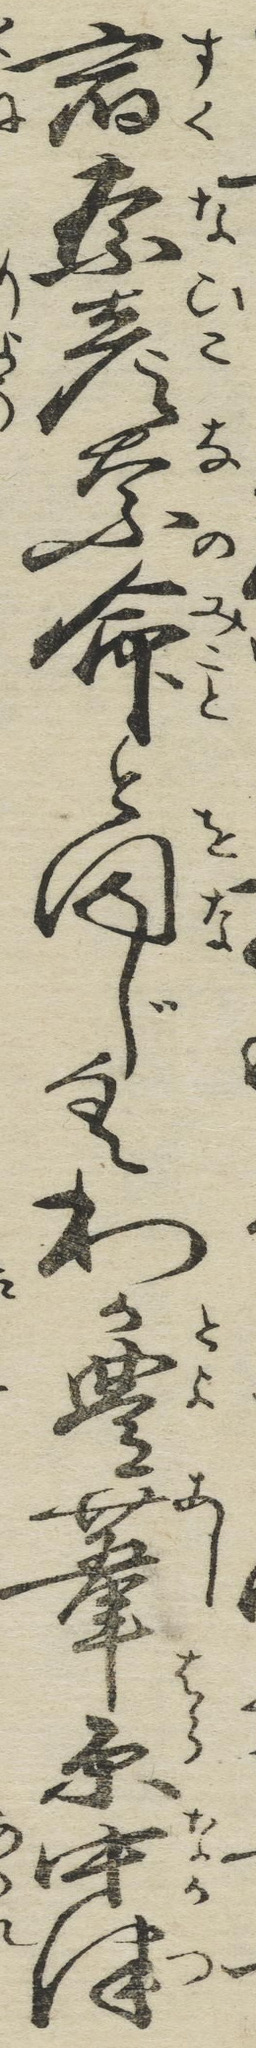宿奈彦奈命と同じくわか豊葦原中津
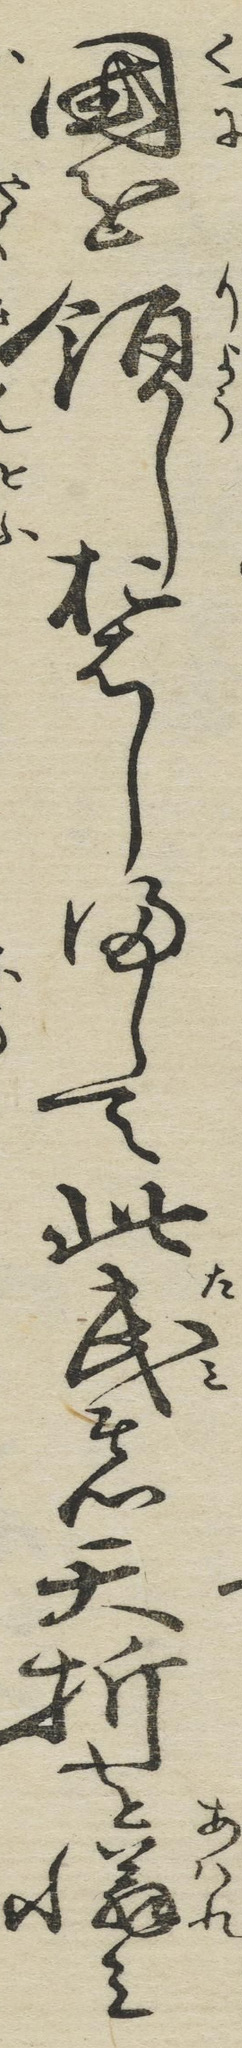國を領しおはしまして此民の夭折を憐み
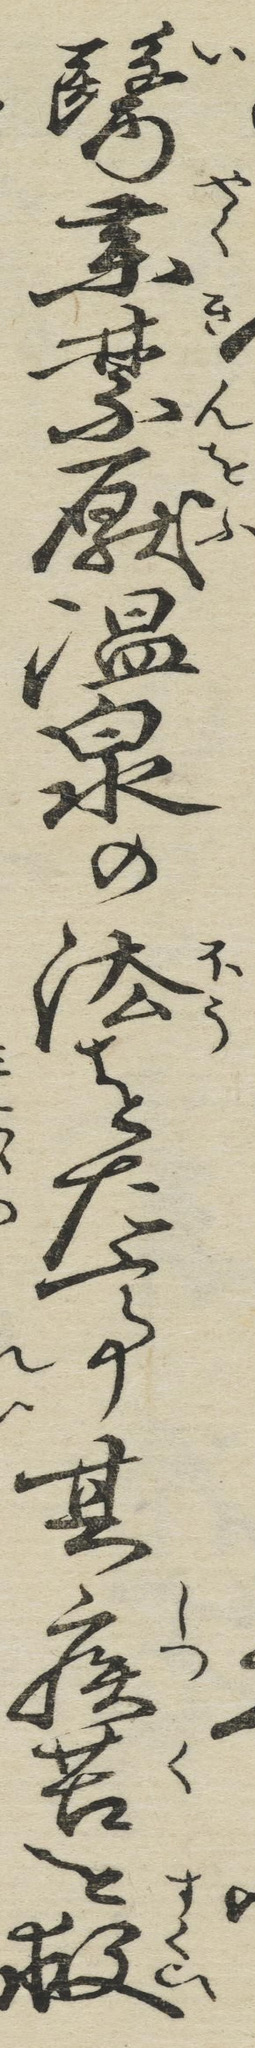醫薬禁厭温泉の法をたつる其疾苦を救
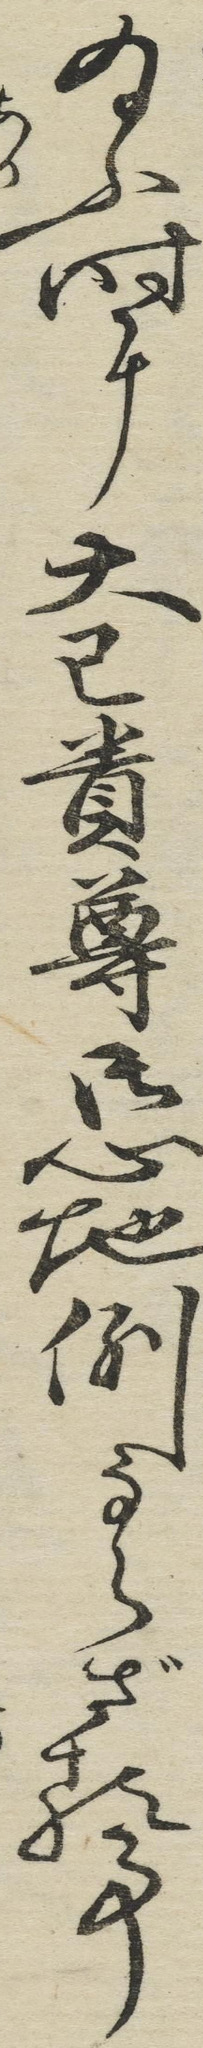給ふ時に大己貴尊御心地例ならざる事
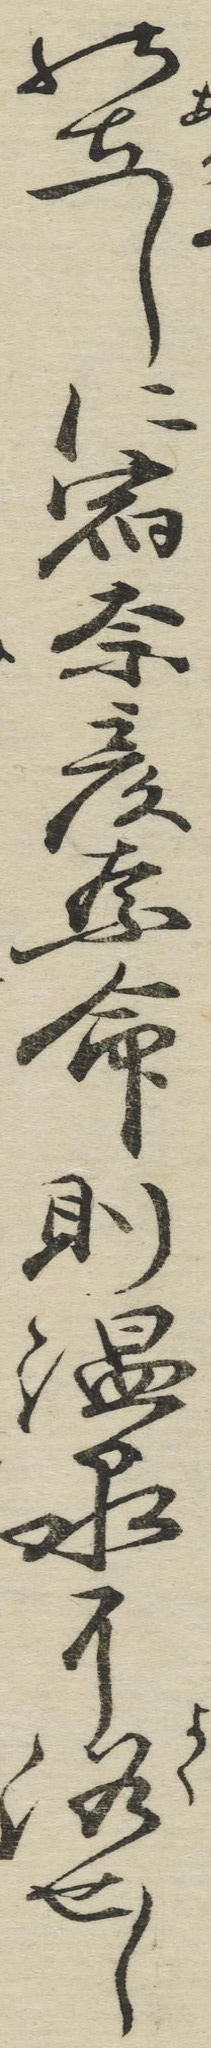の有しに宿奈彦奈命則温泉に浴せし
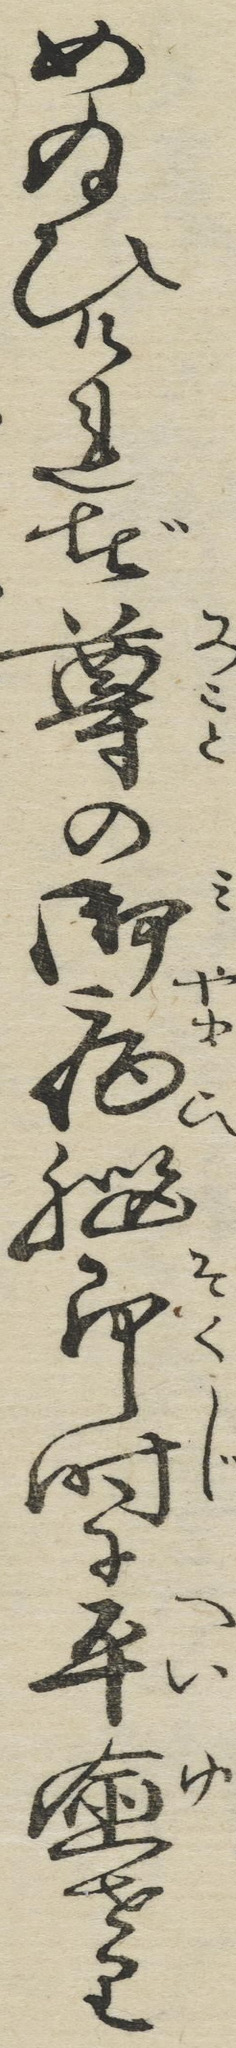め給ひければ尊の御病脳即時に平癒せり
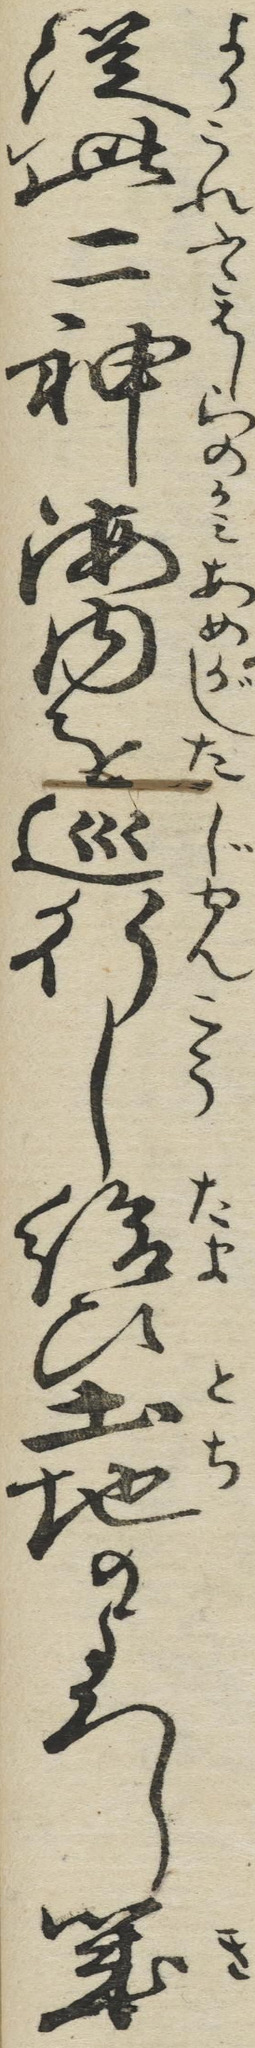從此二神海内を巡行し給ひ土地のよろし幾
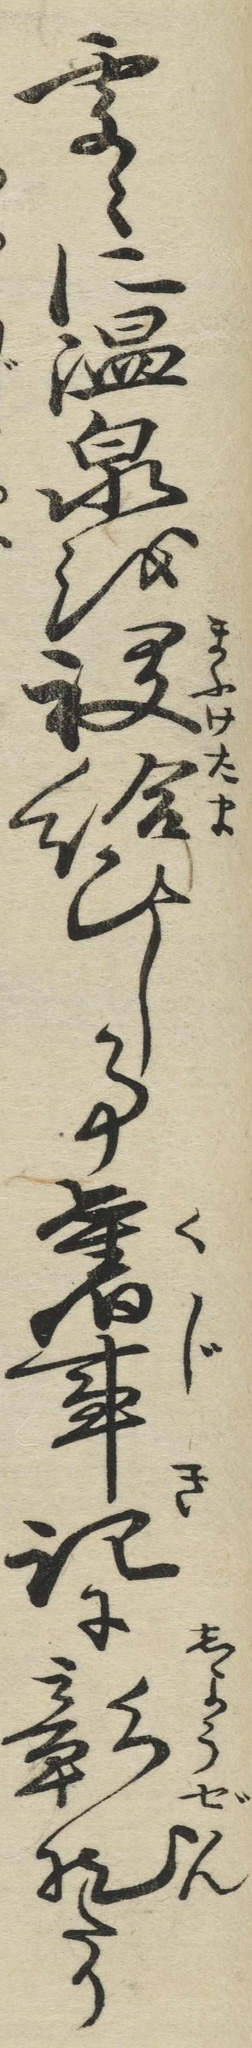處〻に温泉を設給ひし事舊事紀に彰然たり
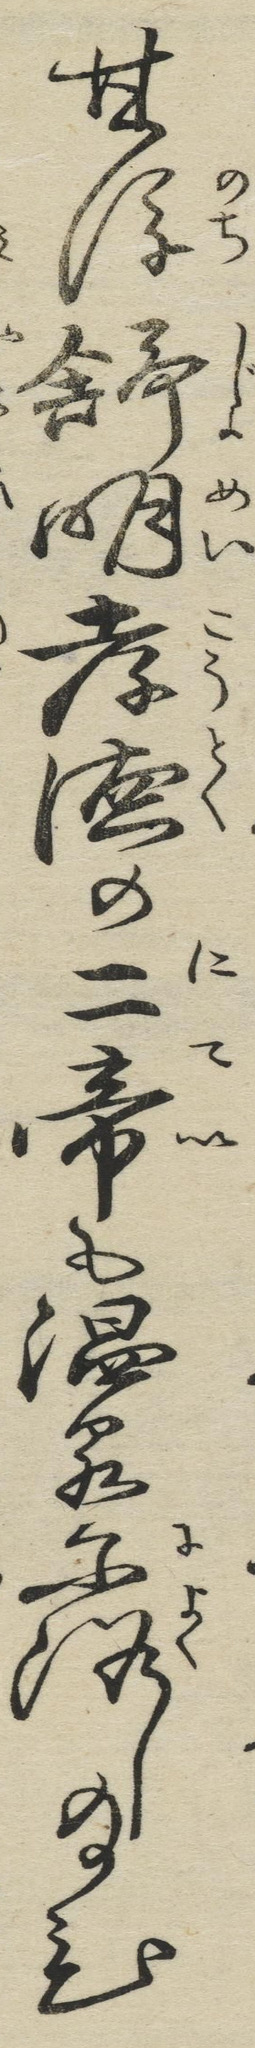其後舒明孝徳の二帝も温泉爾浴し給ひ
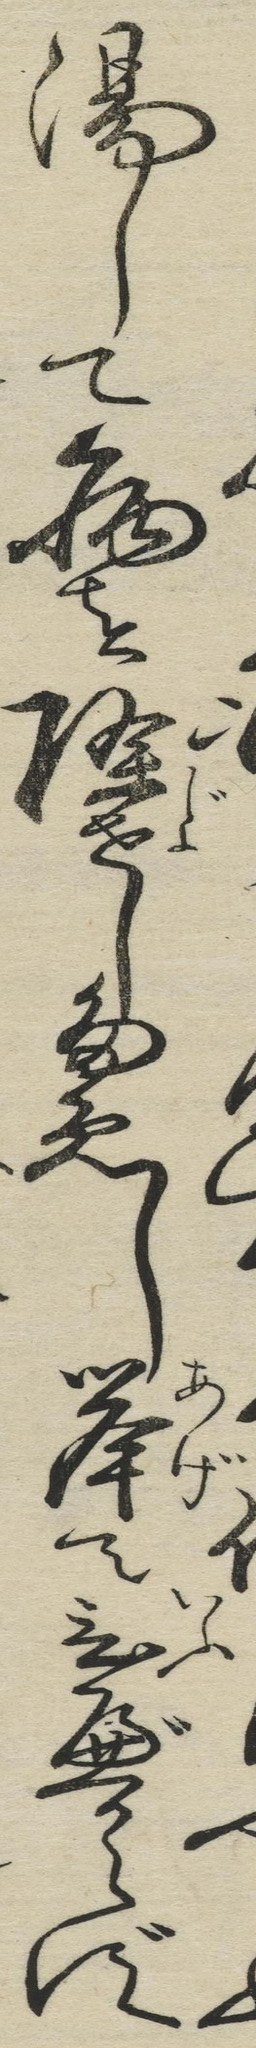湯して病を除せしためし挙て云べからず
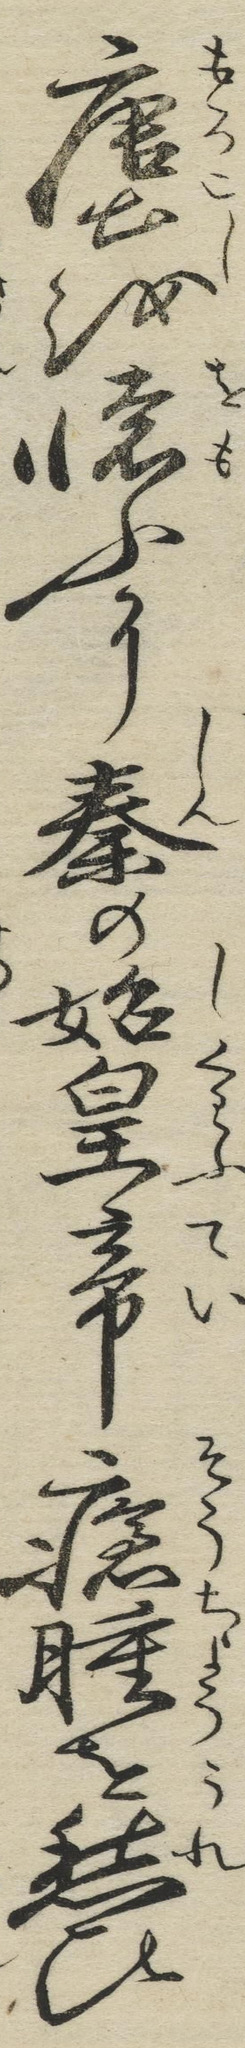唐土を懐ふに秦の始皇帝瘡腫を愁ひ
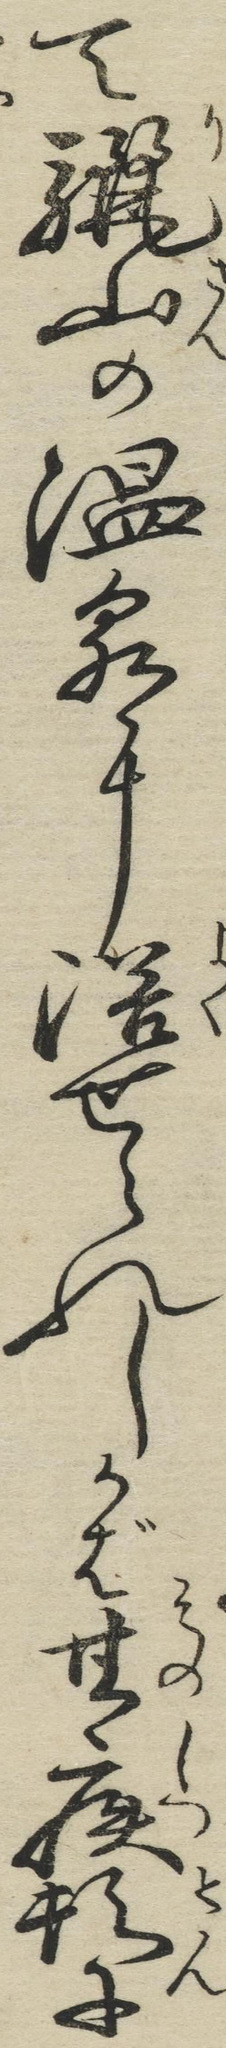て驪山の温泉に浴せられしかば其疾頓に
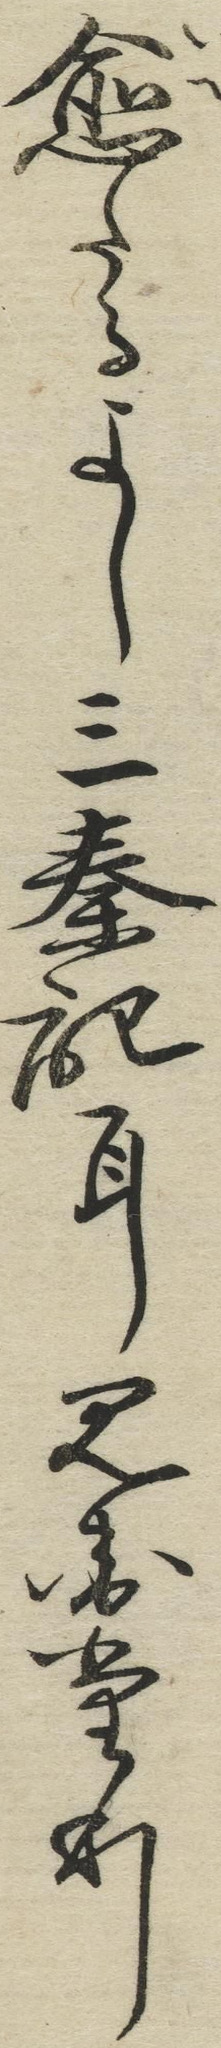癒たるよし三秦記に見えたり

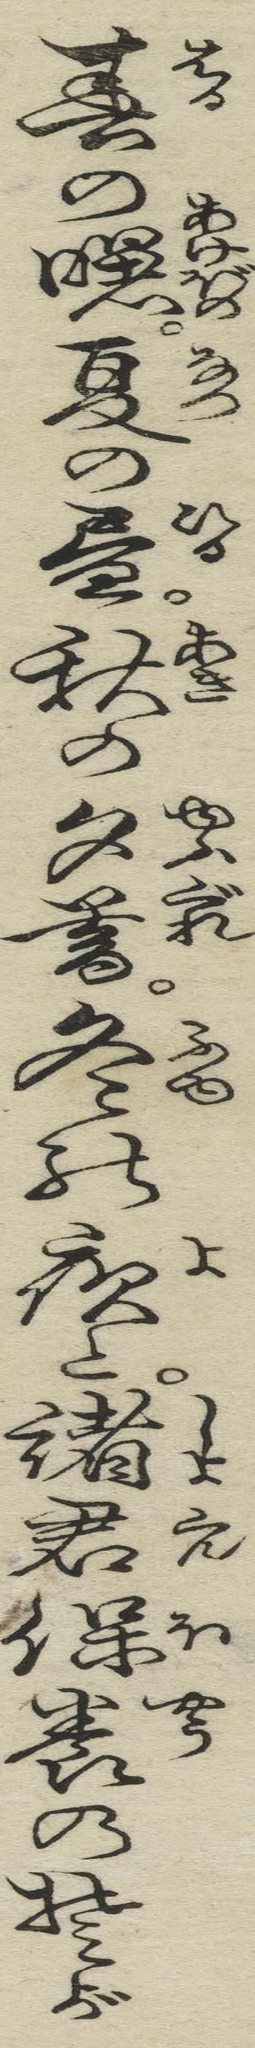春の曙。夏の晝。秋の夕暮。冬の夜と。諸君保養のそが
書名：箱根七湯　温泉圖會　全
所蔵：東京大学地震研究所図書室 Earthquake Research Institute Library, The University of Tokyo, JAPAN
